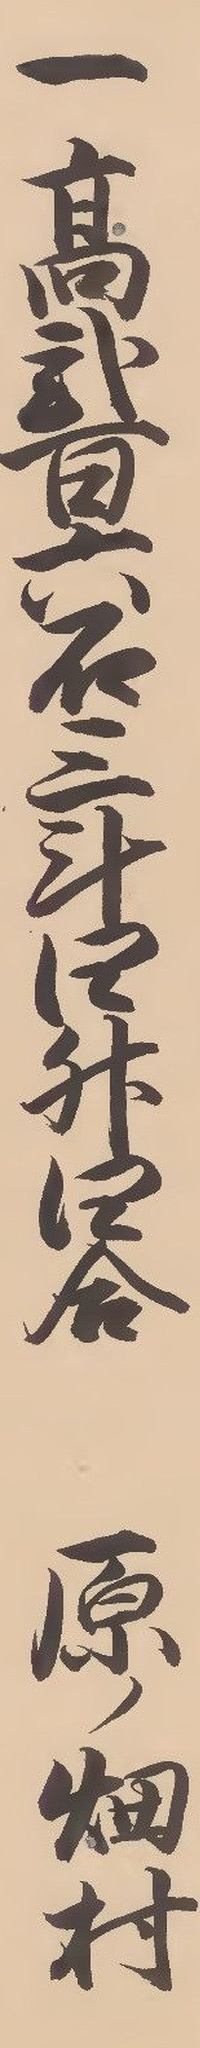一高弐百六石三斗四升四合原ノ畑村
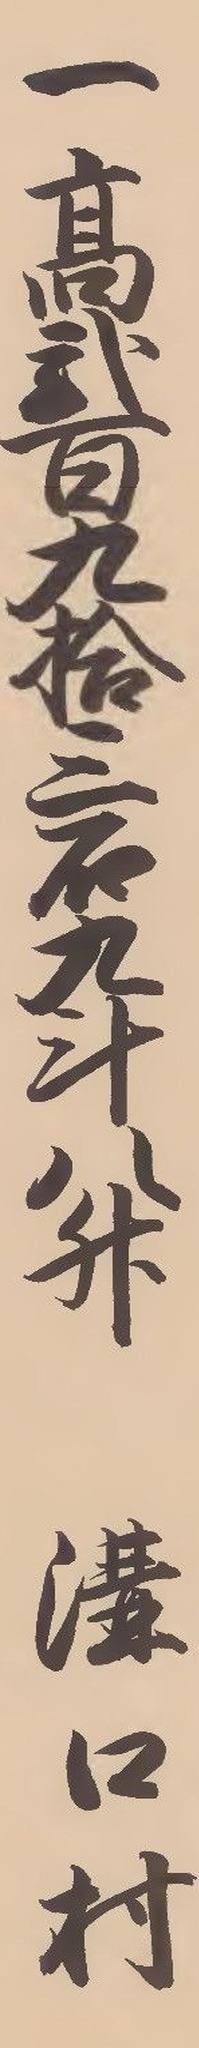一高弐百九拾三石九斗八升溝口村
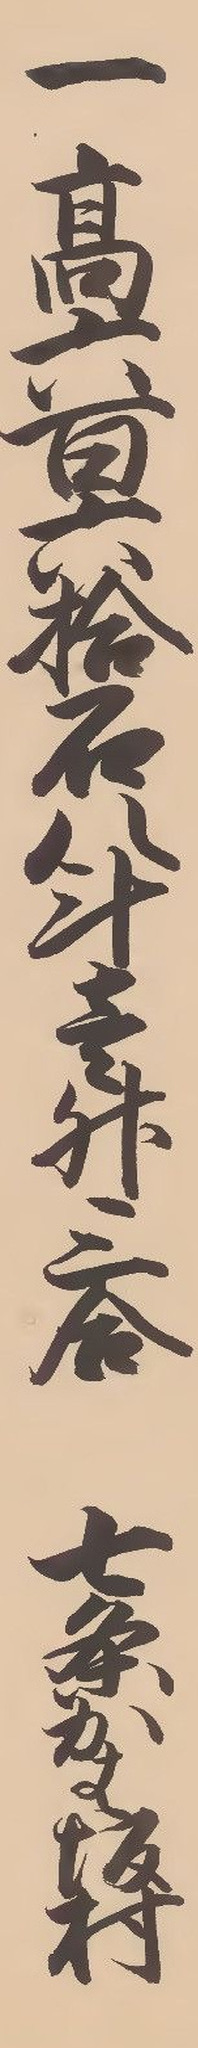一高六百六拾石八斗壱升三合七条かは坂村
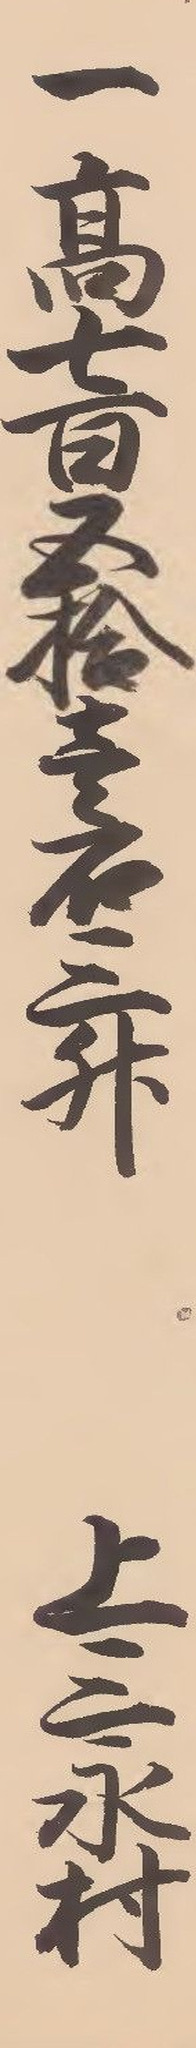一高七百五拾壱石三升上三永村
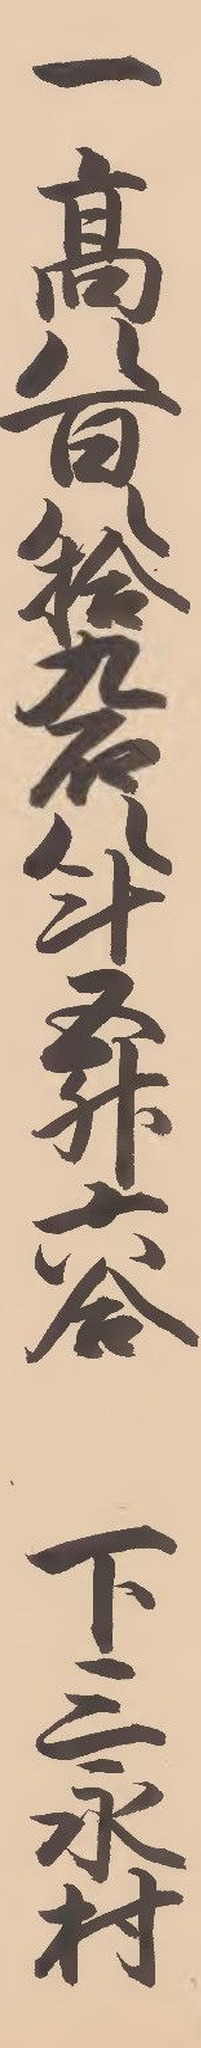一高八百八拾九石八斗五升六合下三永村
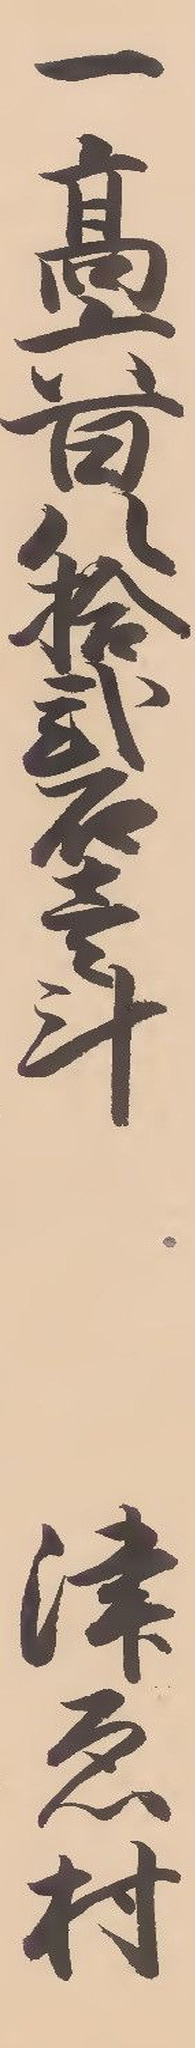一高六百八拾弐石壱斗津ゑ村

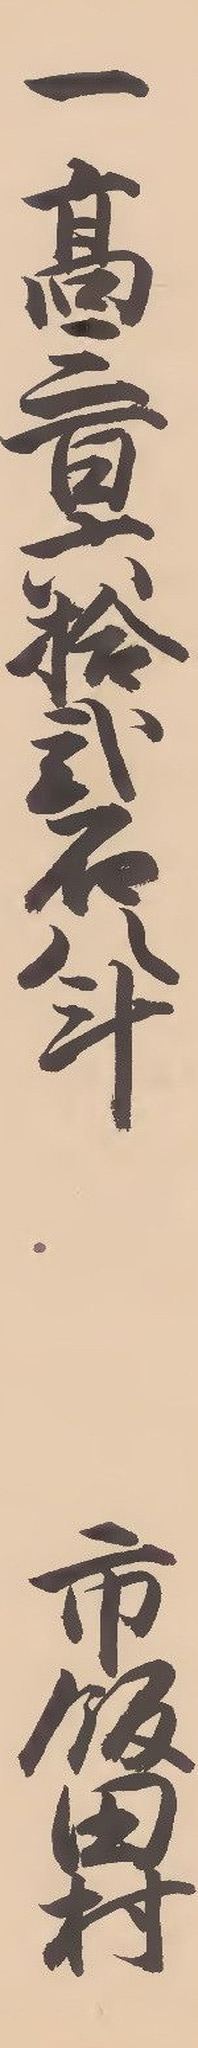一高三百六拾弐石八斗市飯田村
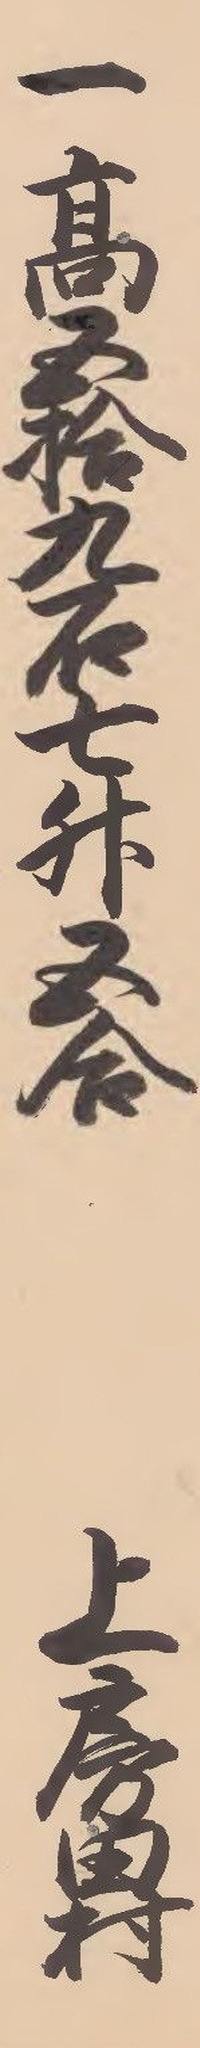一高五拾九石七升五合上房田村
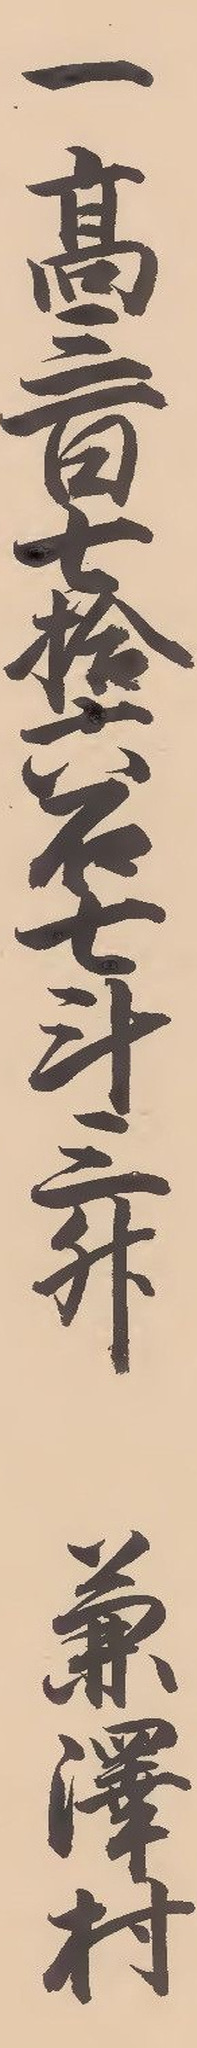一高三百七拾六石七斗三升兼沢村
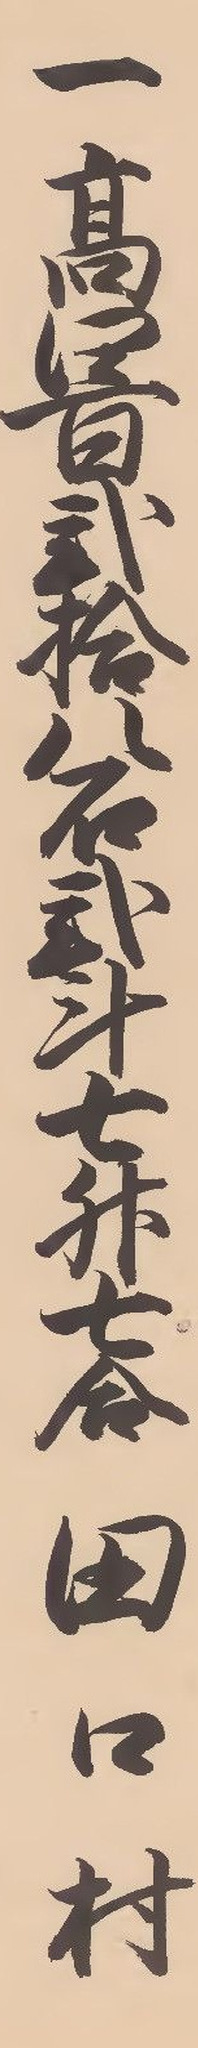一高四百弐拾八石弐斗七升七合田口村
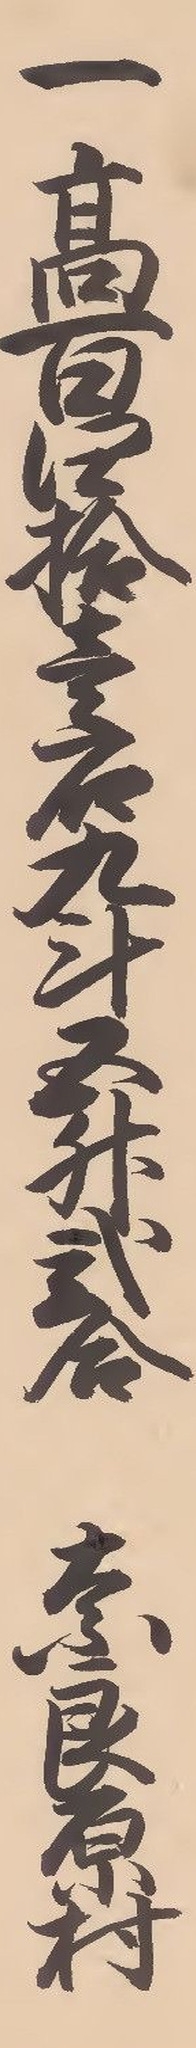一高百四拾壱石九斗五升弐合奈良原村
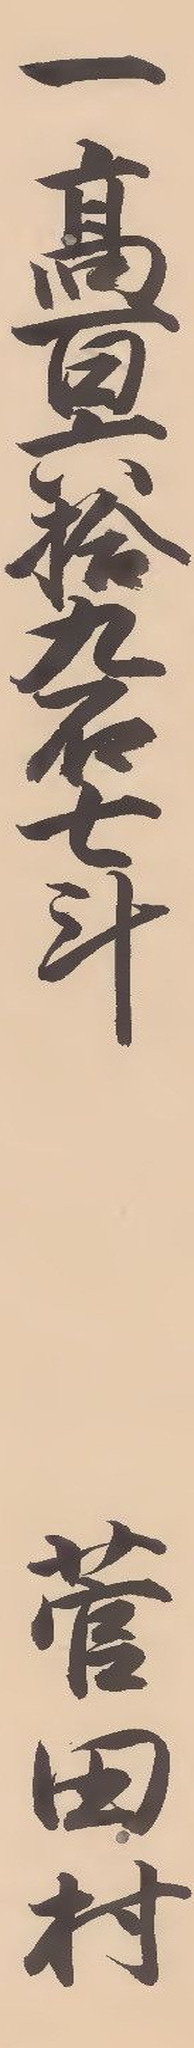一高百六拾九石七斗菅田村
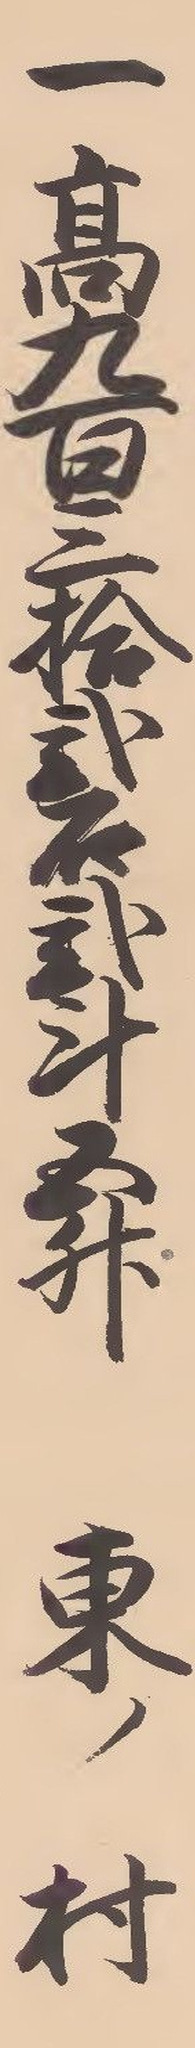一高九百三拾弐石弐斗五升東ノ村

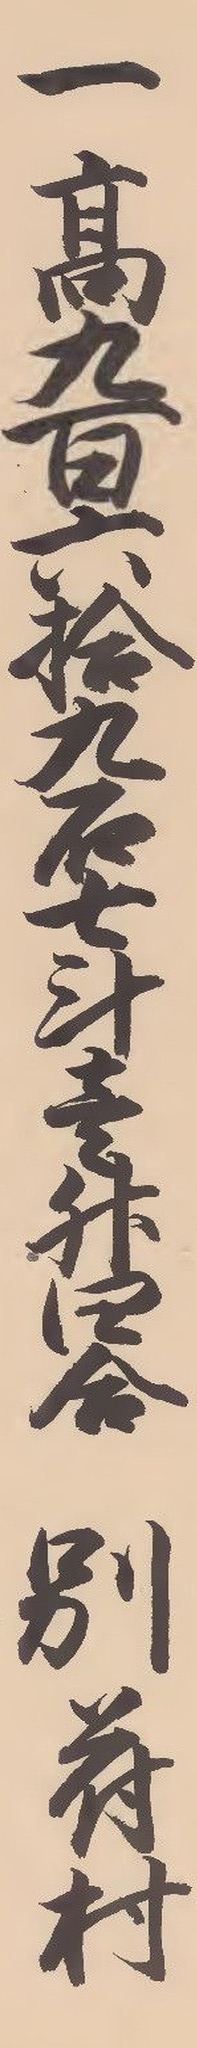一高九百六拾九石七斗壱升四合別府村
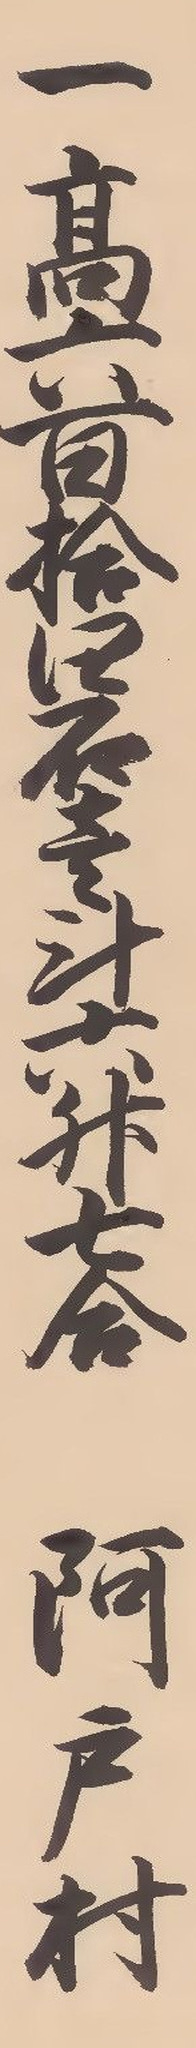一高六百拾四石壱斗六升七合阿戸村
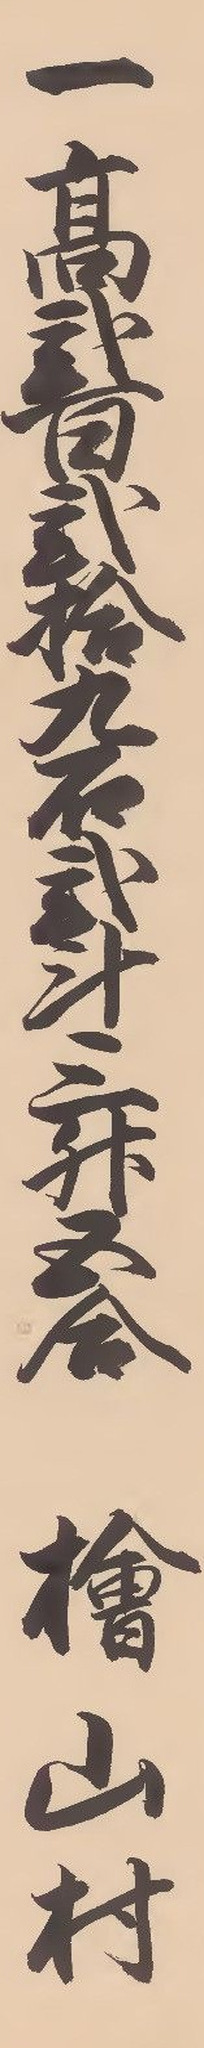一高弐百弐拾九石弐斗三升五合檜山村
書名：安芸国郷帳
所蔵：国立公文書館 National Archives of Japan
